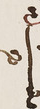مسئلة
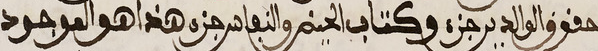حقوق الوالدين جزء وكتاب الحيض والنفاس جزء هذا هو الموجود
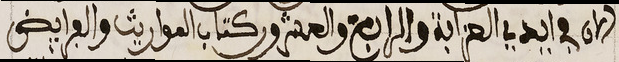الان في ايدي العزابة والرابع والعشرون كتاب المواريث والفرايض
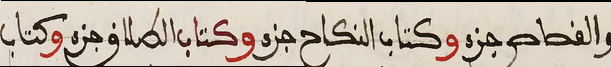والقصاص جزء وكتاب النكاح جزء وكتاب الطلاق جزء وكتاب
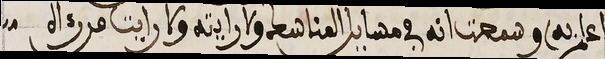اعلم به وسمعت انه في مسايل المناسك ولا رايته ولا رايت من رءاه
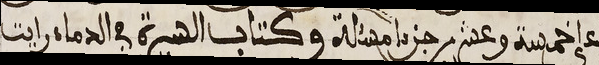على خمسة وعشرين جزءا مسئلة وكتاب السيرة في الدماء رايت
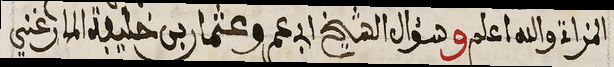المزاتي والله اعلم وسؤال الشيخ ابي عمر وعثمان بن خليفة المارغني
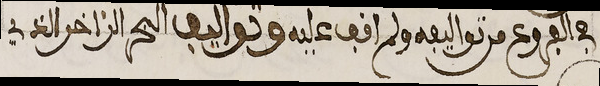في الفروع من تواليفه ولم اقف عليه وتواليف البحر الزاخر الذي
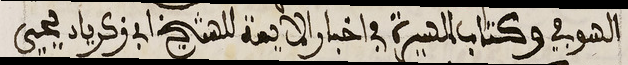السوفي وكتاب السيرة في اخبار الايمة للشيخ ابي زكرياء يحيى
